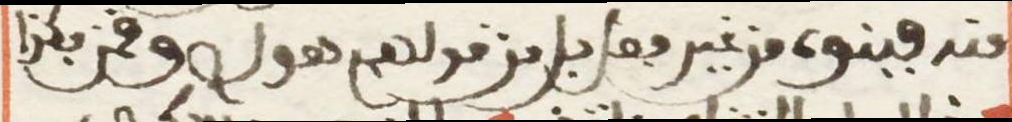منه فبنوه من غير فعل بل من قولهم هو لص وقمن بكذا
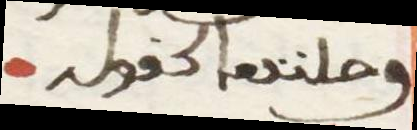وصلتها كقوله
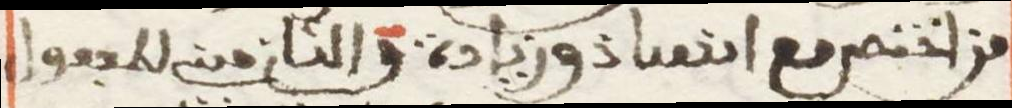من اختص مع انهما ذو زيادة والثاني منه للمفعول
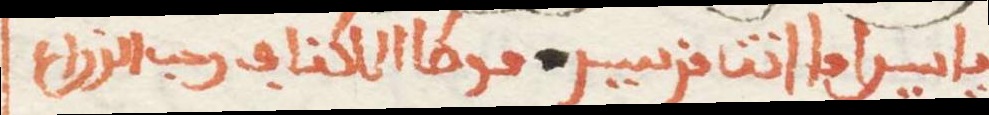يا سيد اما انت من سيد موطا الاكناف رحب الذراع
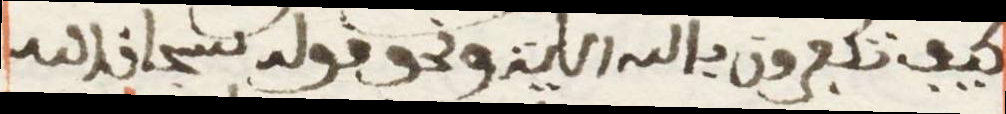كيف تكفرون بالله الاية ونحو قوله سبحان الله
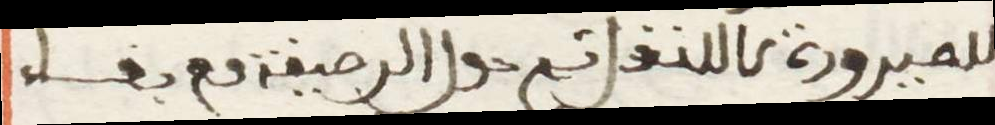للصيرورة لا للنقل ثم حول الى صيغة مع بقاء
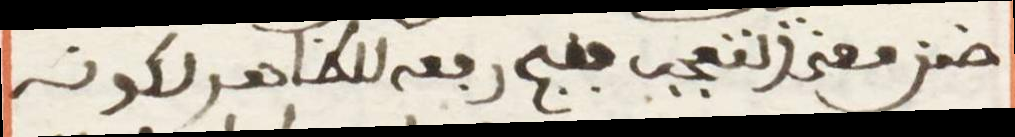ضمن معنى التعجب فقبح رفعه للظاهر لكونه
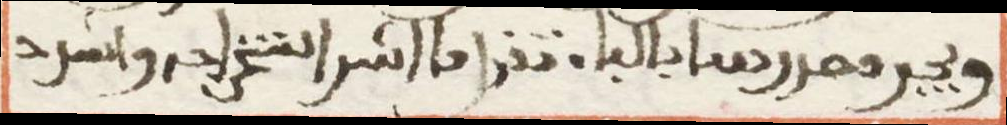ويجر مصدرهما بالباء تقول ما اشد استخراجه واشد حـ
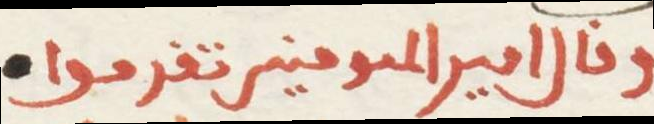وقال امير المومنين تقدموا
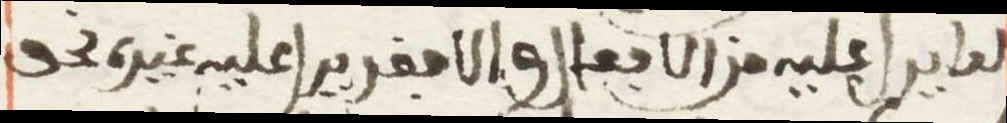لما يدل عليه من الافعال والا فقد يدل عليه غيره نحو
